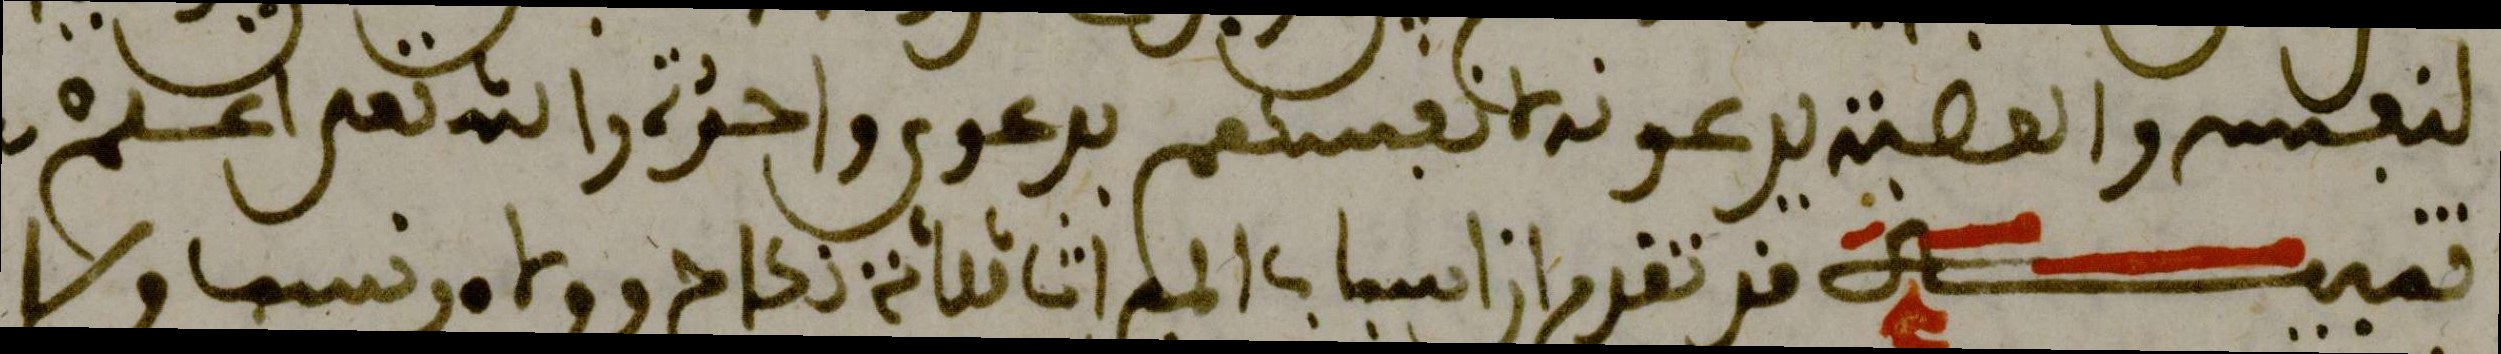لنفسه والعصبة يدعونه لانفسهم بدعوى واحد والله تعلى اعلمْ
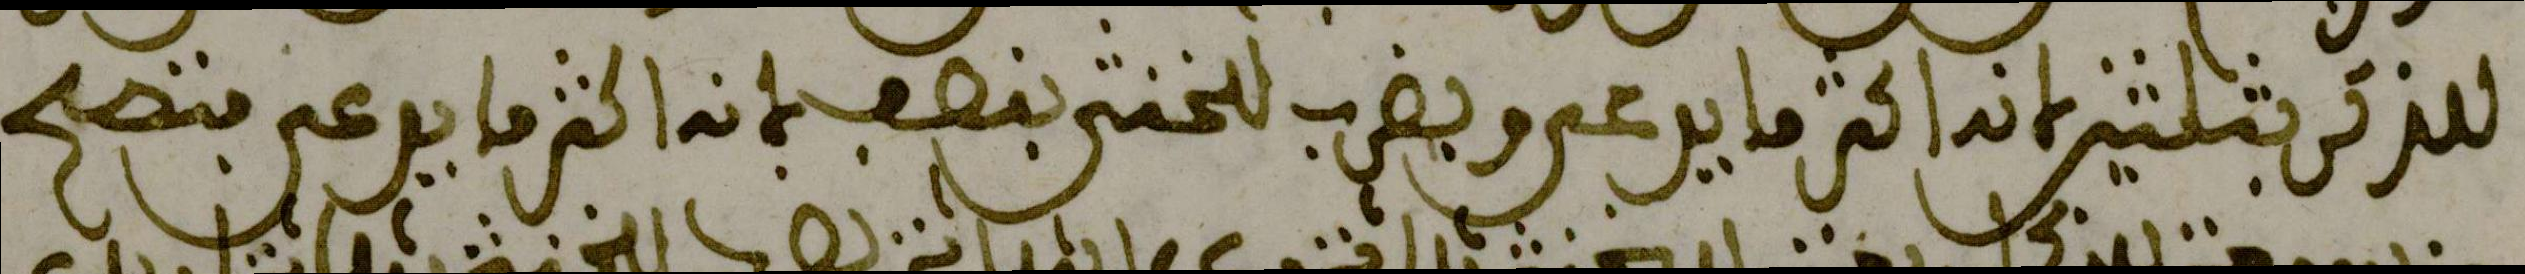للذكر بثلثين لانه اكثر ما يدعى ويضر للخنثى بنصف لانه اكثر ما يدعى فتصح
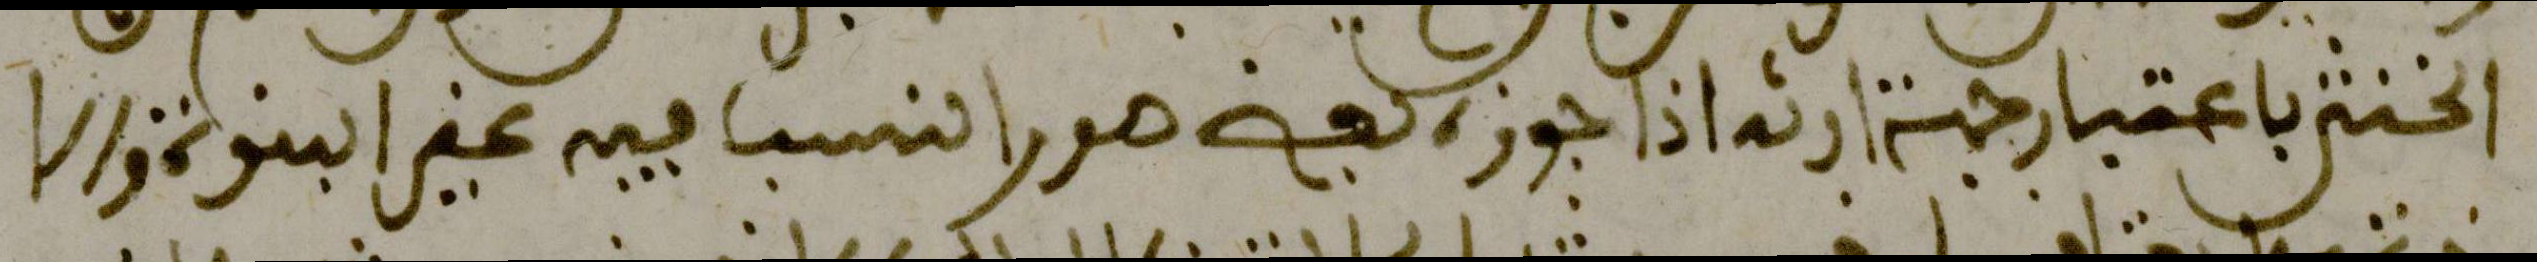الخنثى باعتبار جهة ارثه اذا جوزه بعض صور النسب فيه غير البنوة والا
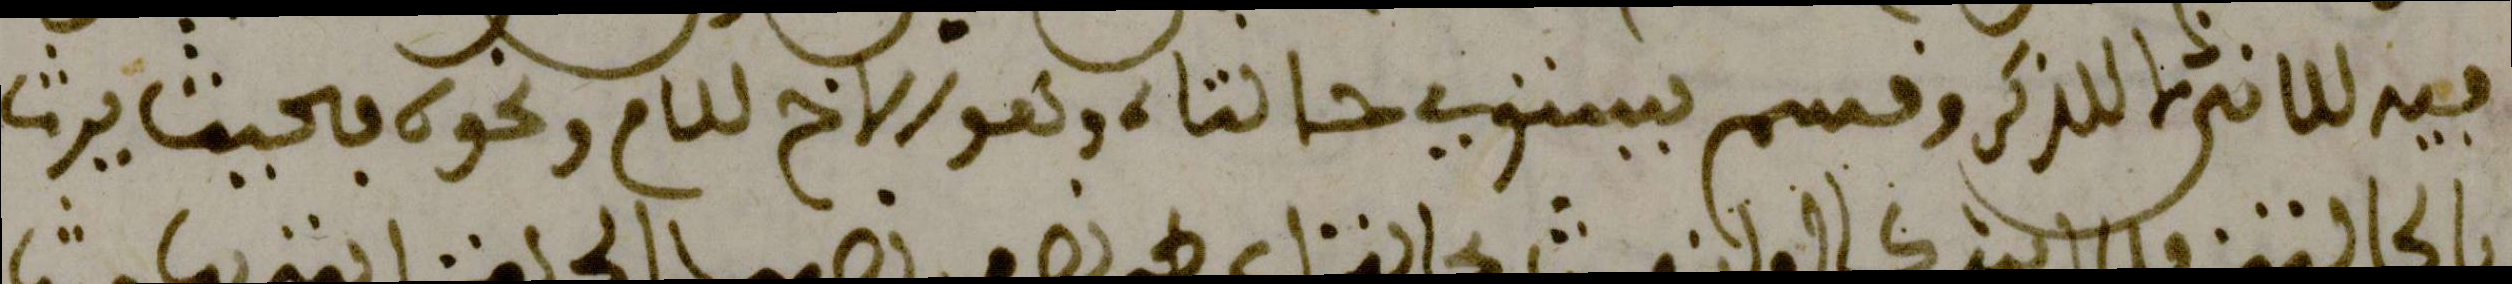فيه للانثى لا للذكر وقسم يستوي حالتاه وهو الاخ للام ونحوه فحيث يرث
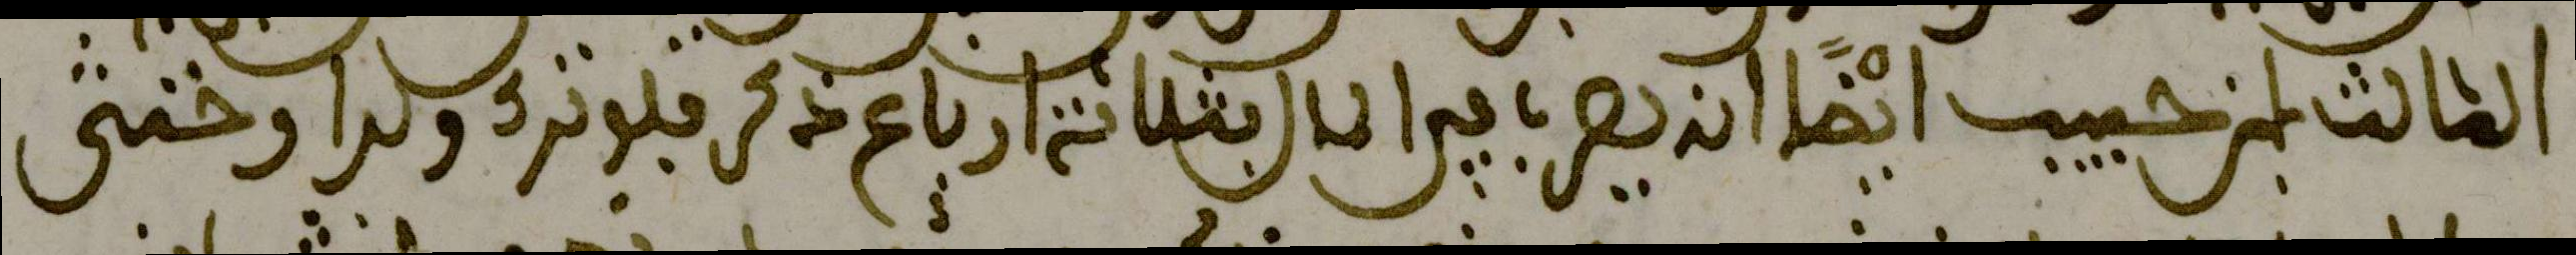الثالث لابن حبيب ايْضًا انه يضرب في المال بثلاثة ارباع ذكر فلو ترك ولد او خنثى
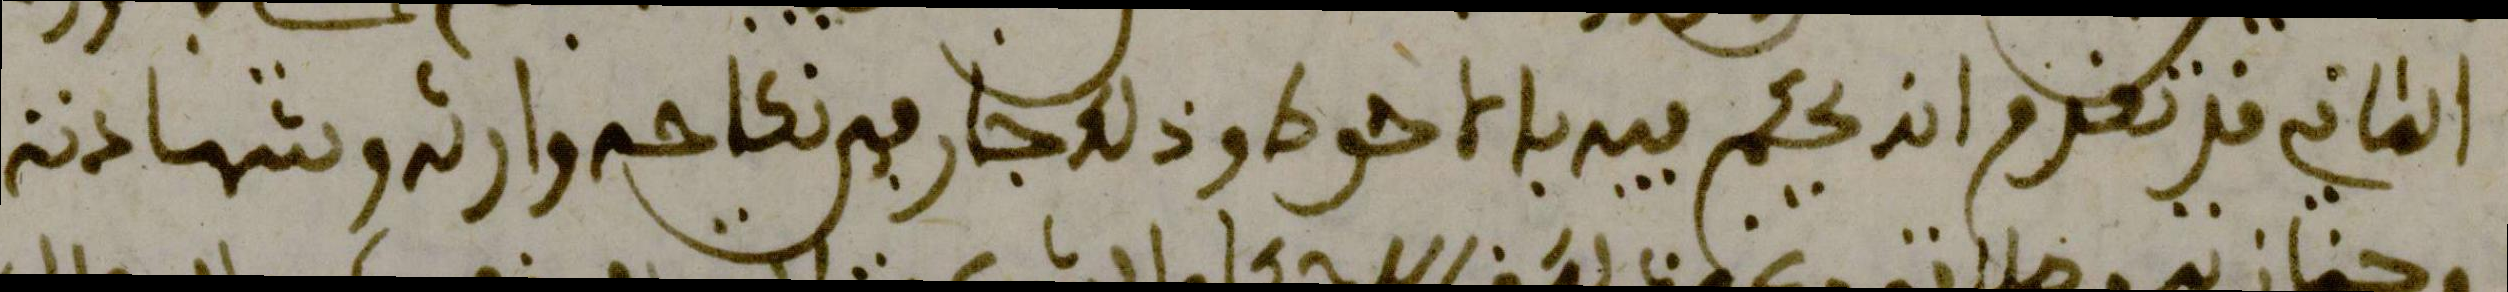الثاني قد تقدم انه يحكم فيه بالاحوط وذلك جار في نكاحه وارثه وشهادته
